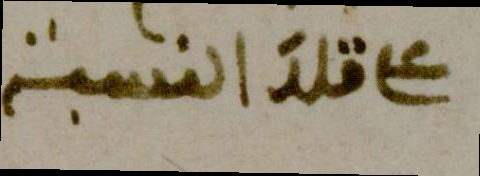على تلك النسبة
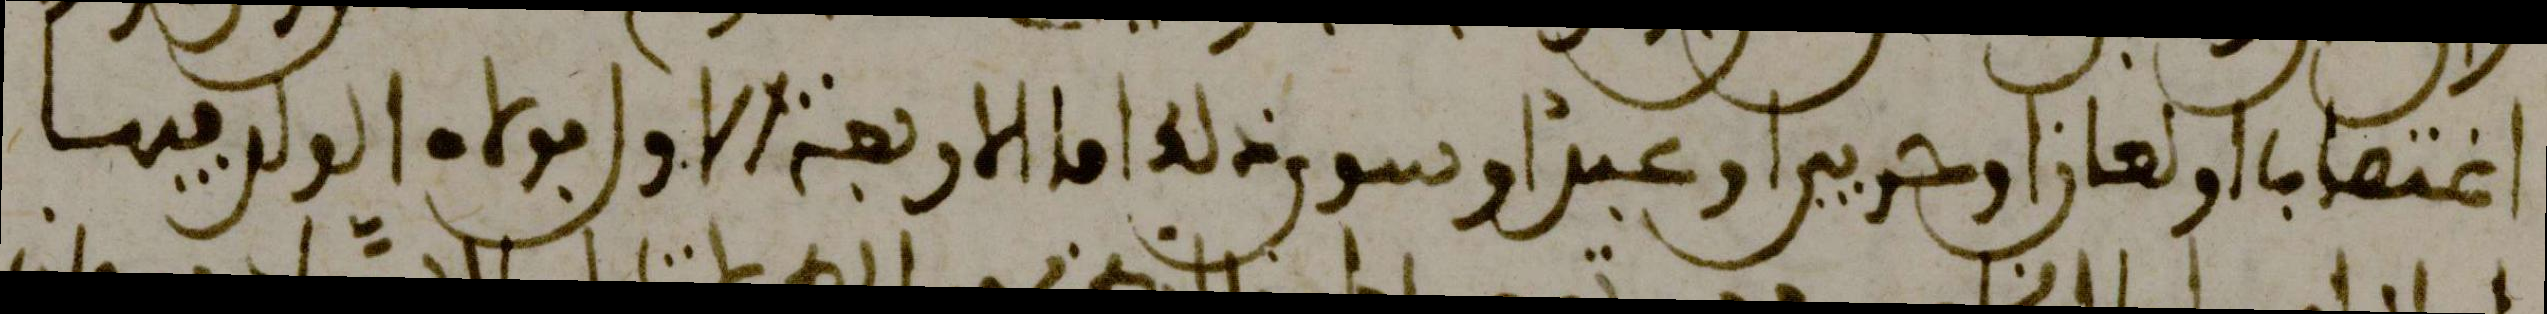اغتصاب او لعان او حربي او عبد او سوى ذلك اما الاربعة الاول فولاء الولد فيها
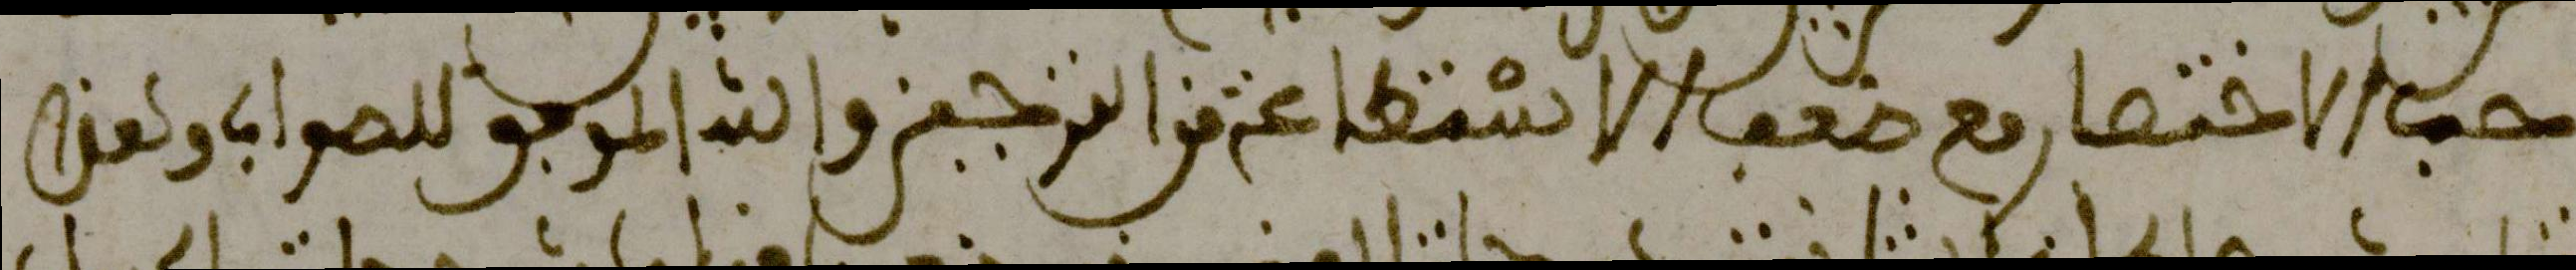حب الاختصا رفع ضعف الاستطاعة من الترجيز والله الموفق للصواب وهذا
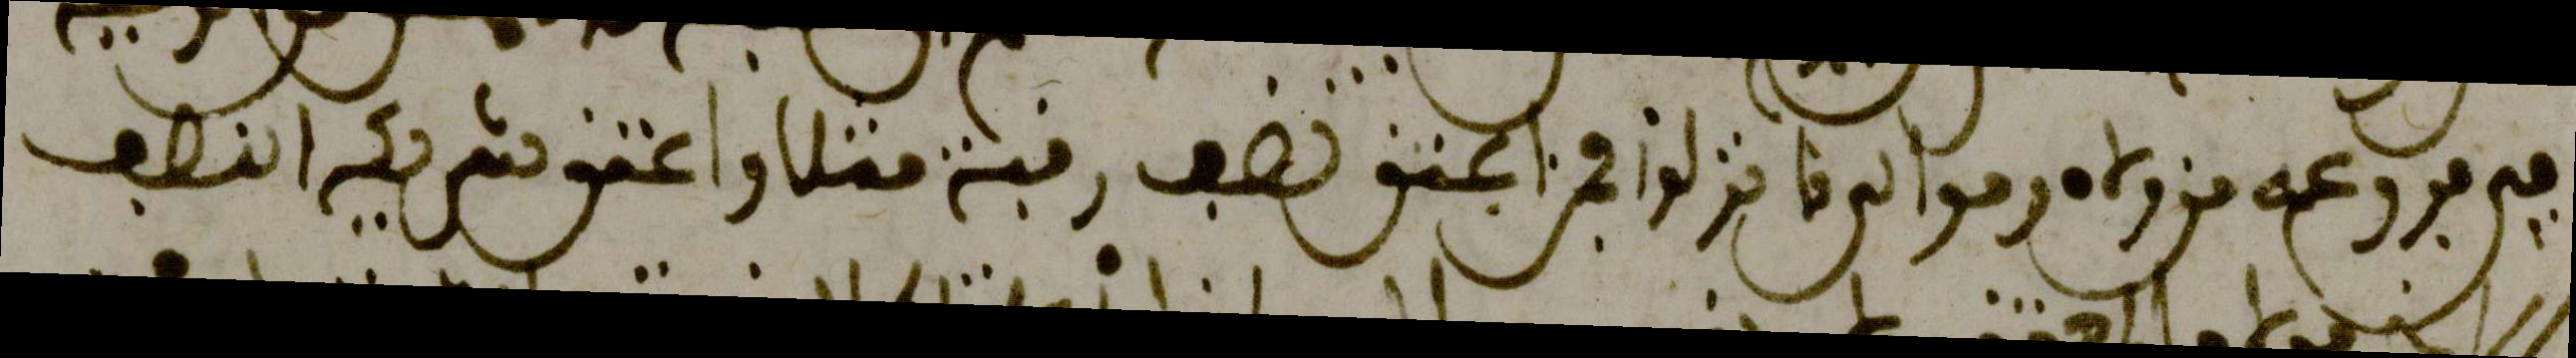في فروعه من ولاء وموالى ما نزلوا فمن اعتق نصف رقبة مثلا واعتق شريكه النصف
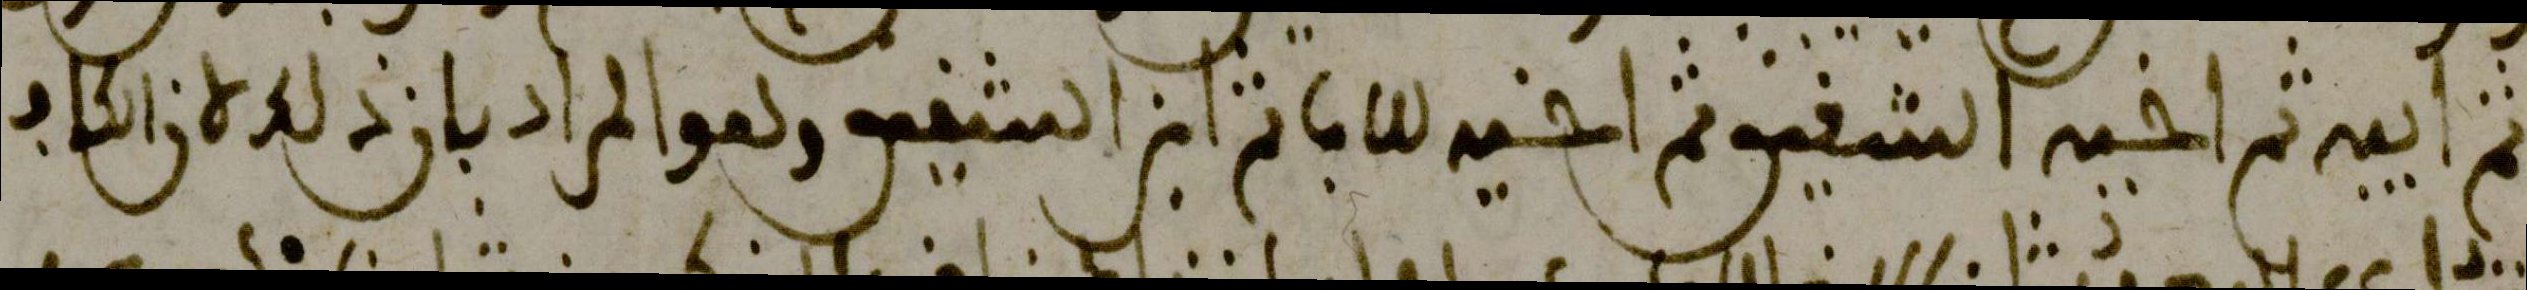ثم ابيه ثم اخيه والشقيق ثم اخيه للاب ثم ابن الشقيق وهو المراد بان ذلك لان الكاف
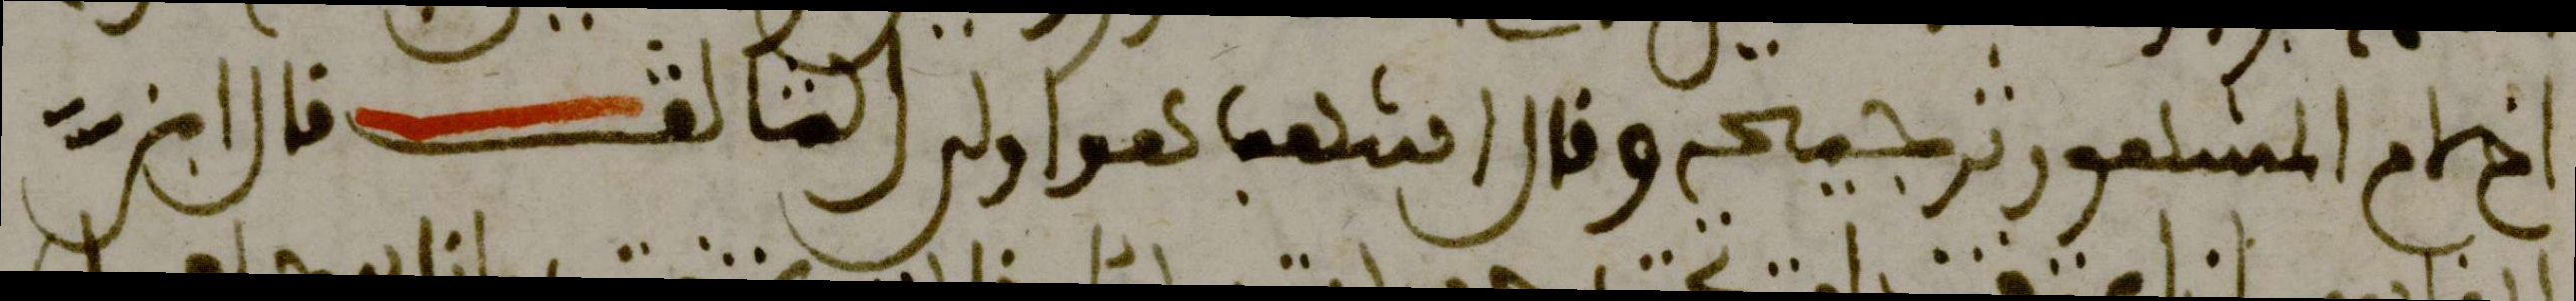اخ لام المشهور ترجيحه وقال اشه هو اولى الثالث قال ابن
